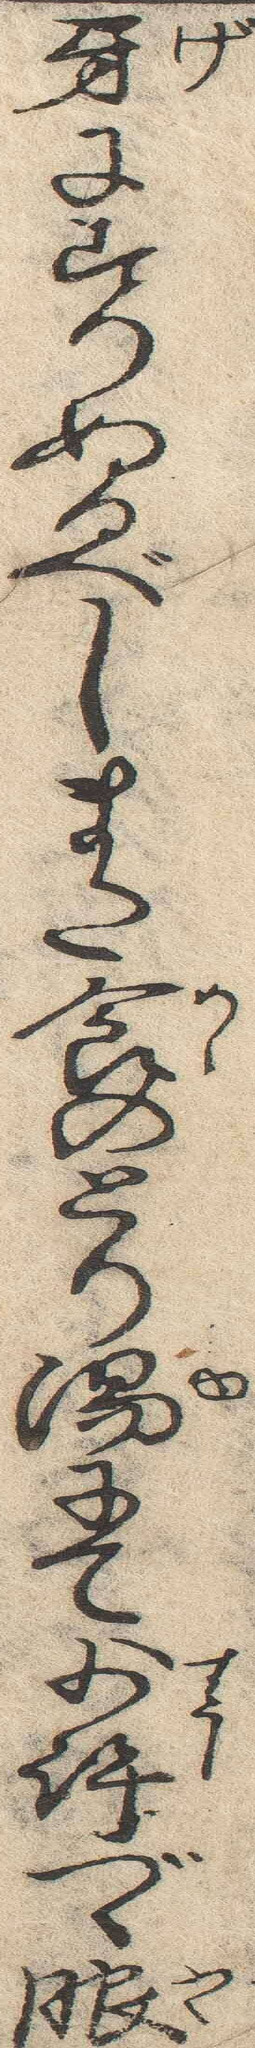牙にすりぬるべしまた食のとり湯にて少許づゝ服
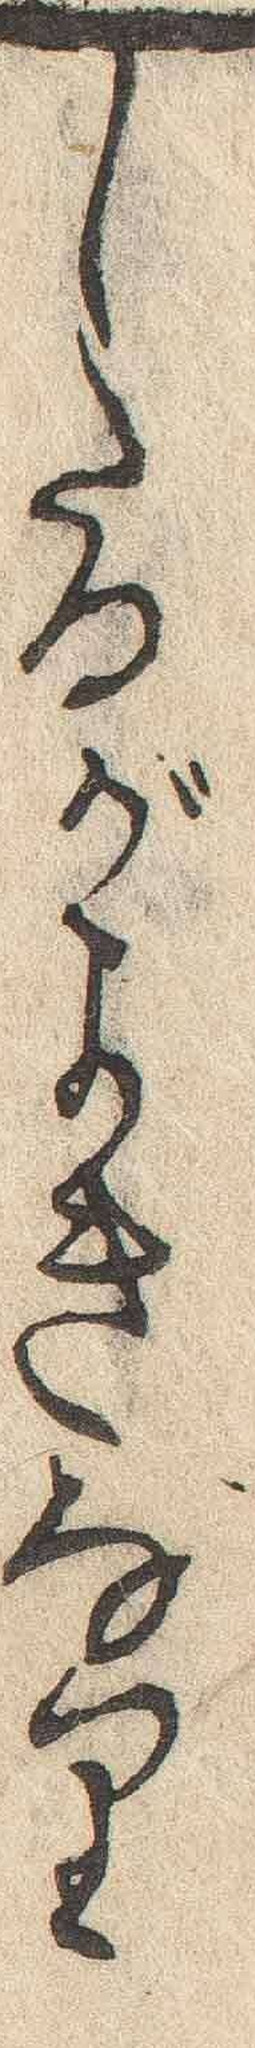したるがよきなり
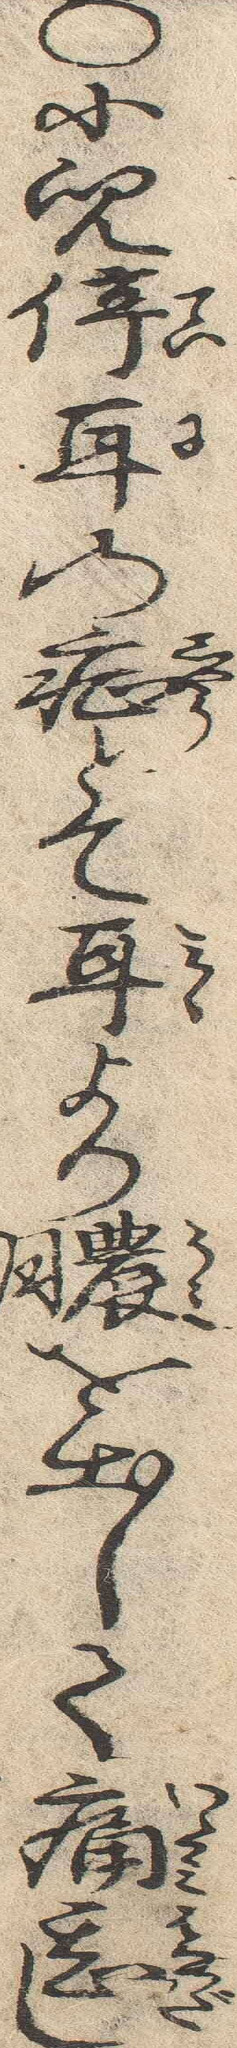○小児停耳の症とて耳より膿を出して痛甚し
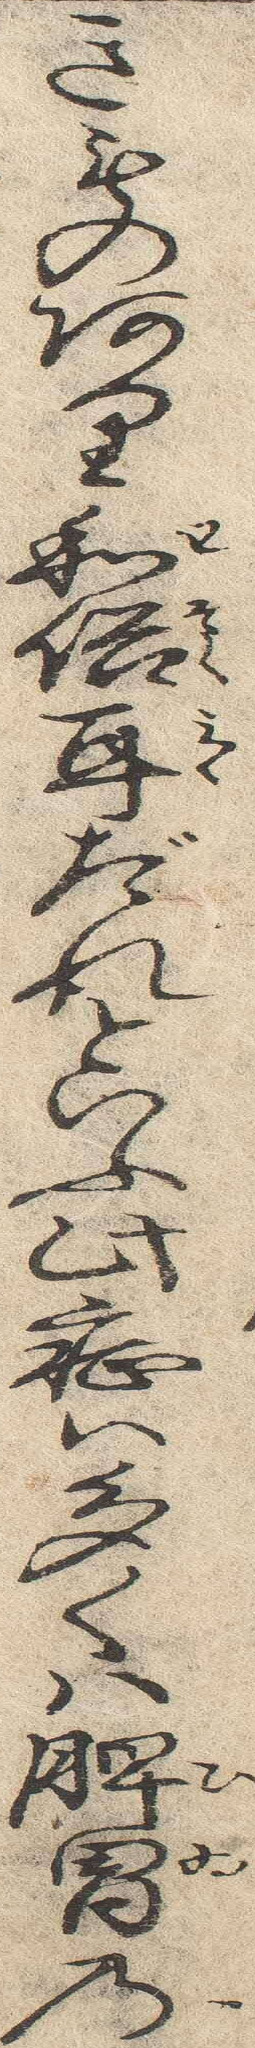きものあり和俗耳だれといふ此症は多くは脾胃の
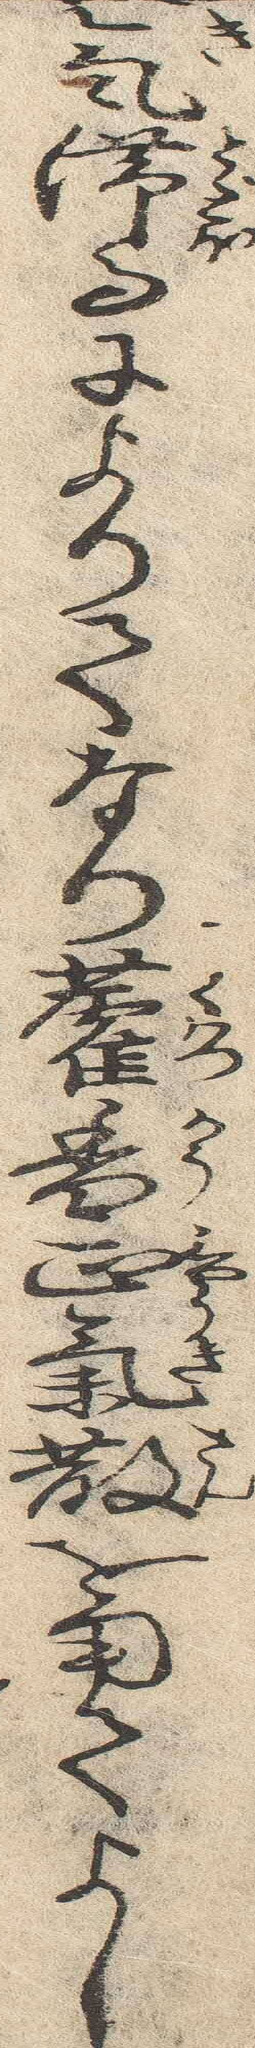気滞るによりてなり藿香正気散を用てよし
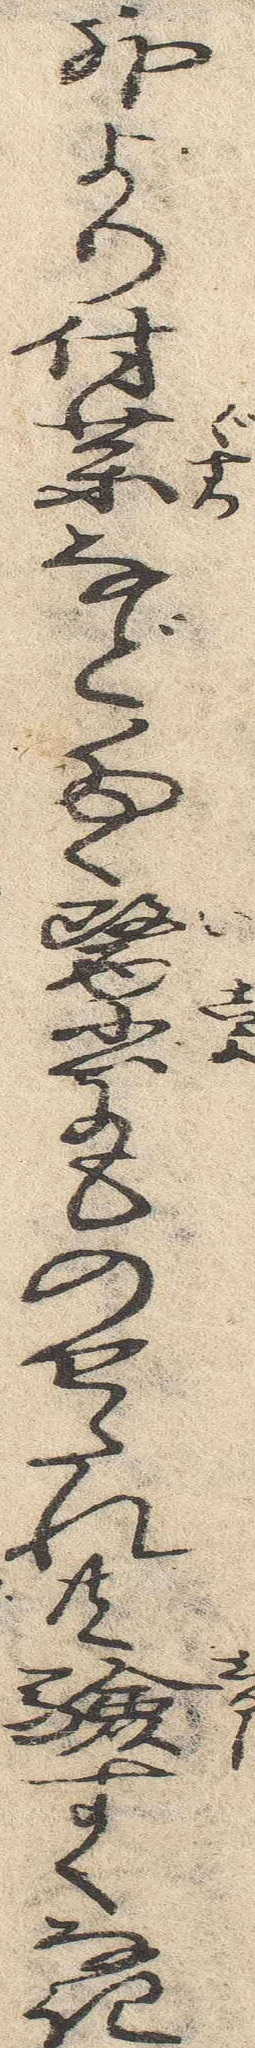外より付薬など多く医書にものせたれ共験すくなき
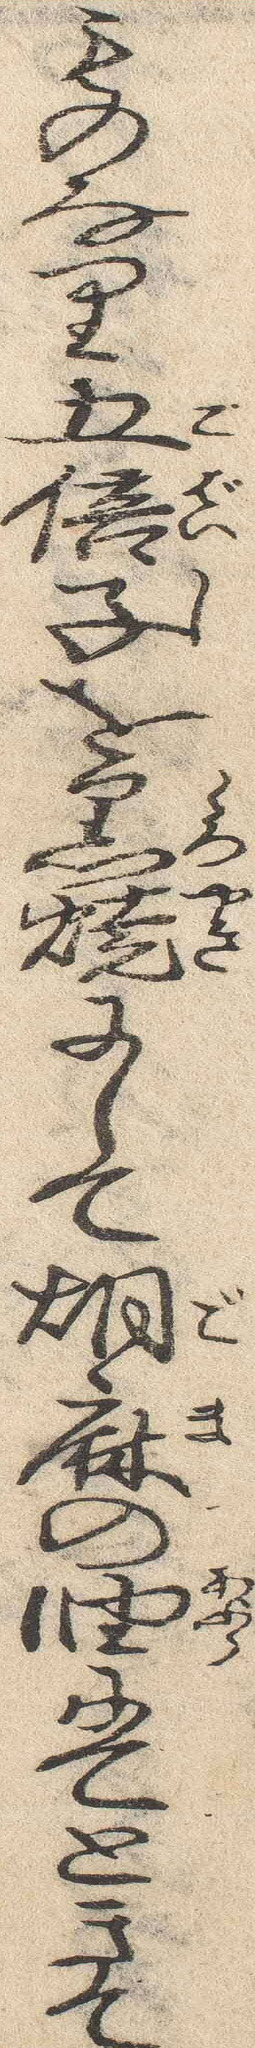ものなり五倍子を黒焼にして胡麻の油にてときて
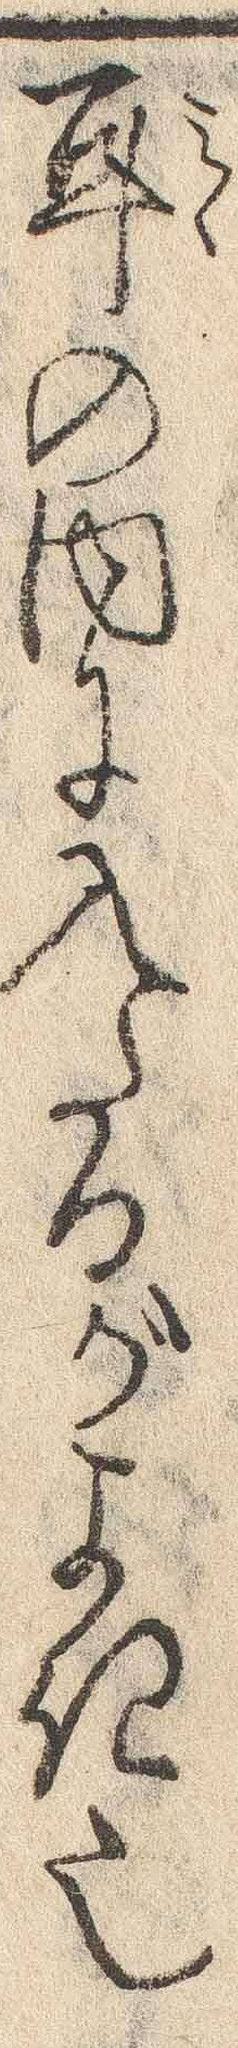耳の内に入たるがよき也
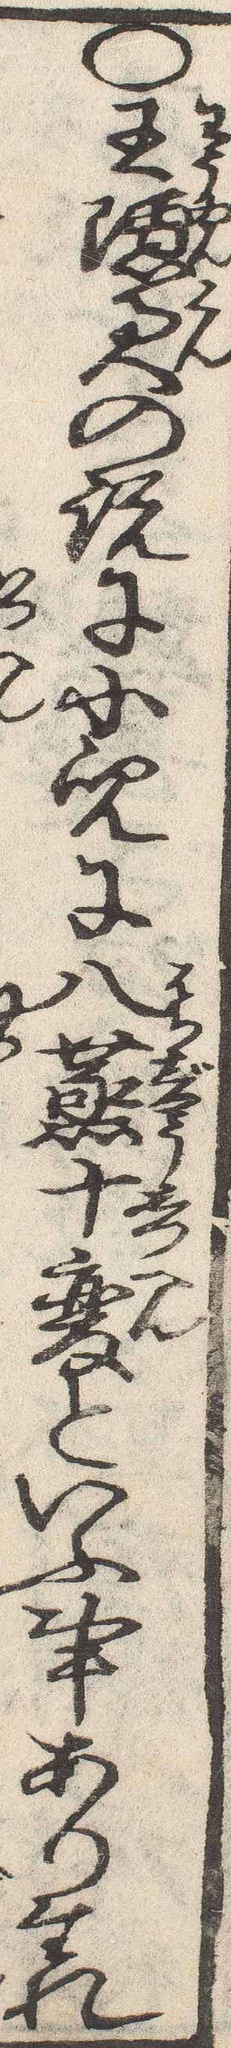王隠君の説に小児に八蒸十変といふ事あり生れ
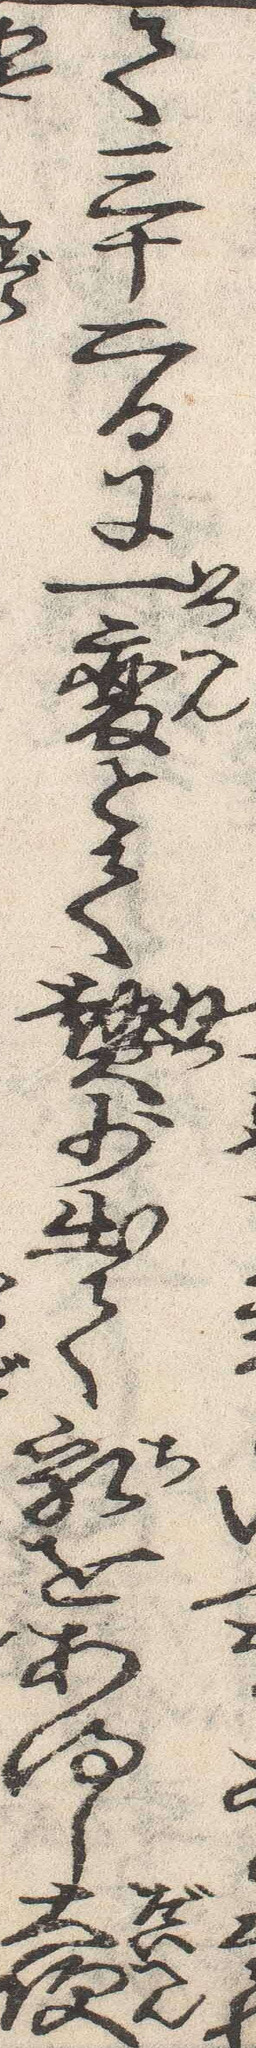て三十二日に一変とて熱少出て乳をあまし大便
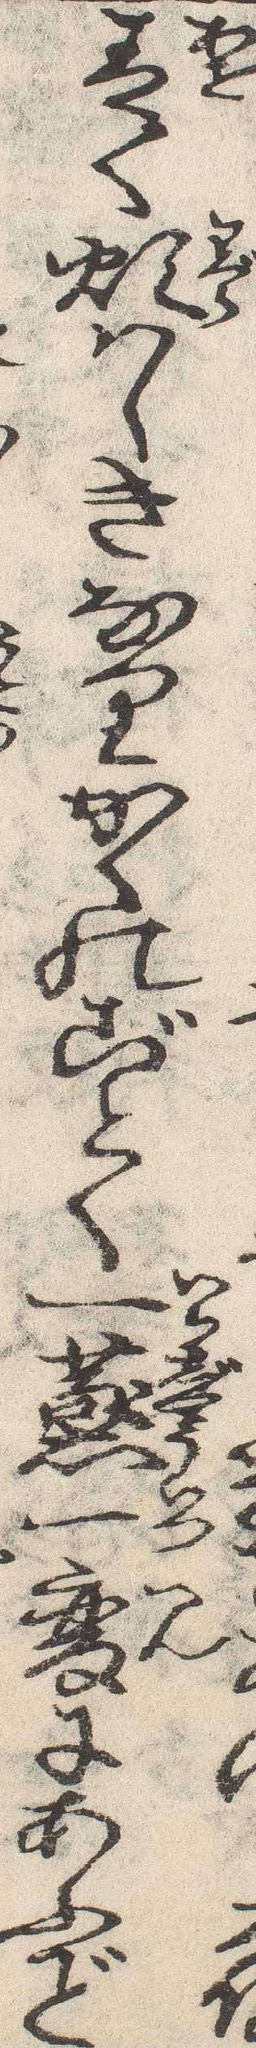青く煩はしきなりかくのごとく一蒸一変にあふごと
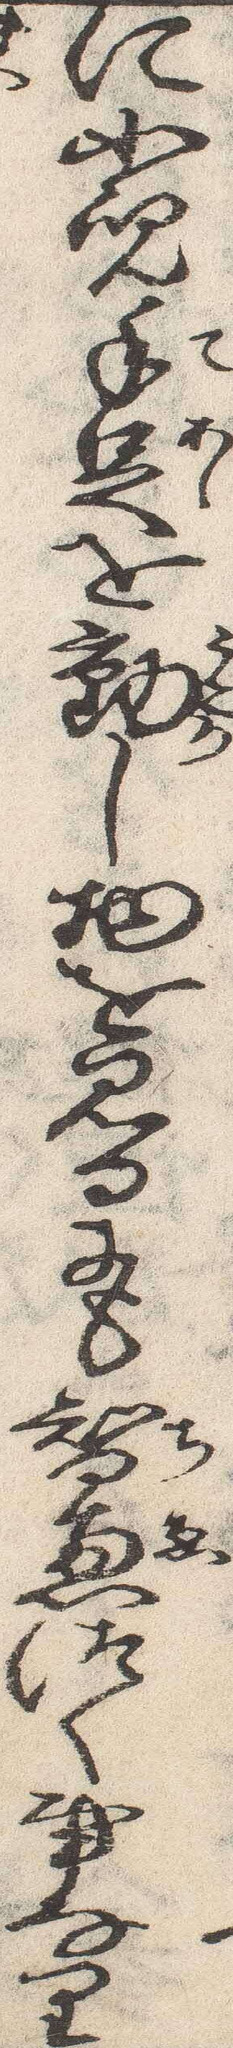に小児手足を動し物を見るにも智恵つく事なり
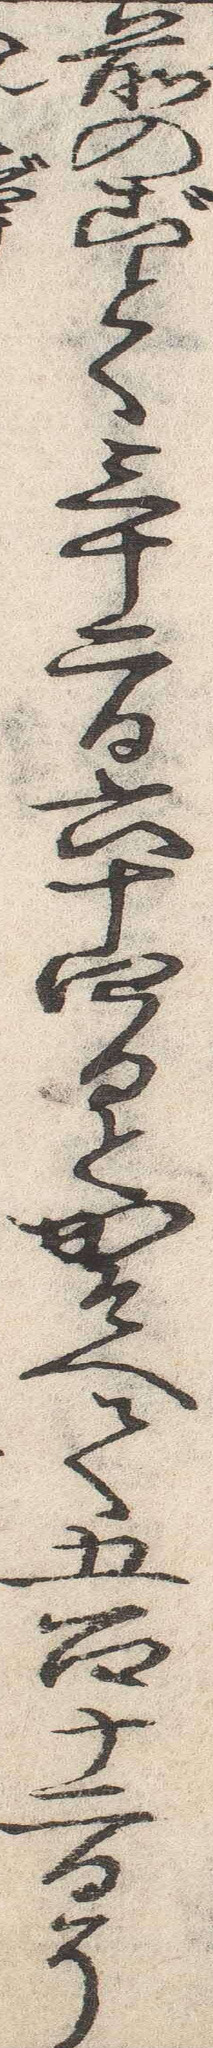前のごとく三十二日六十四日とかそへて五百十二日に
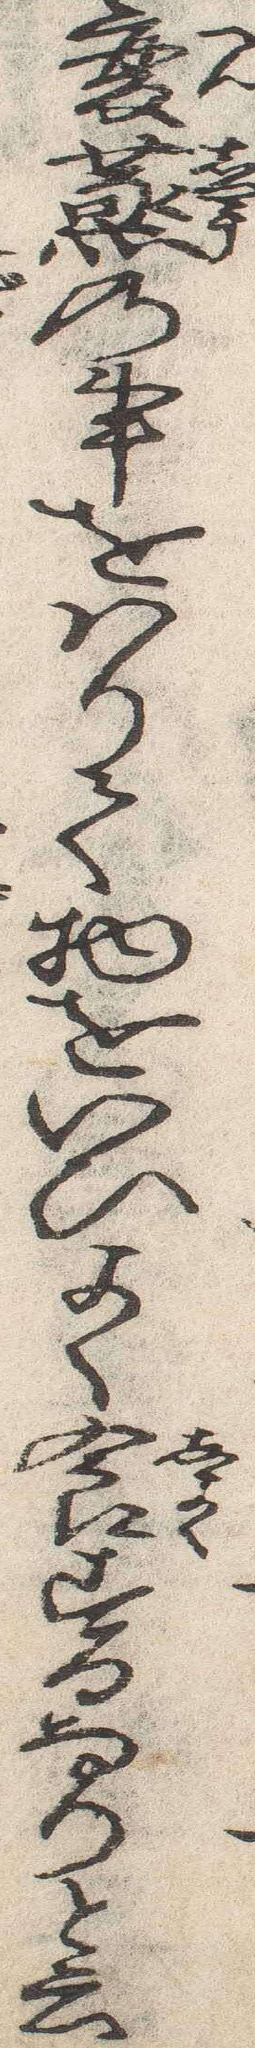変蒸の事をはりて物をいひよく食するなりと云
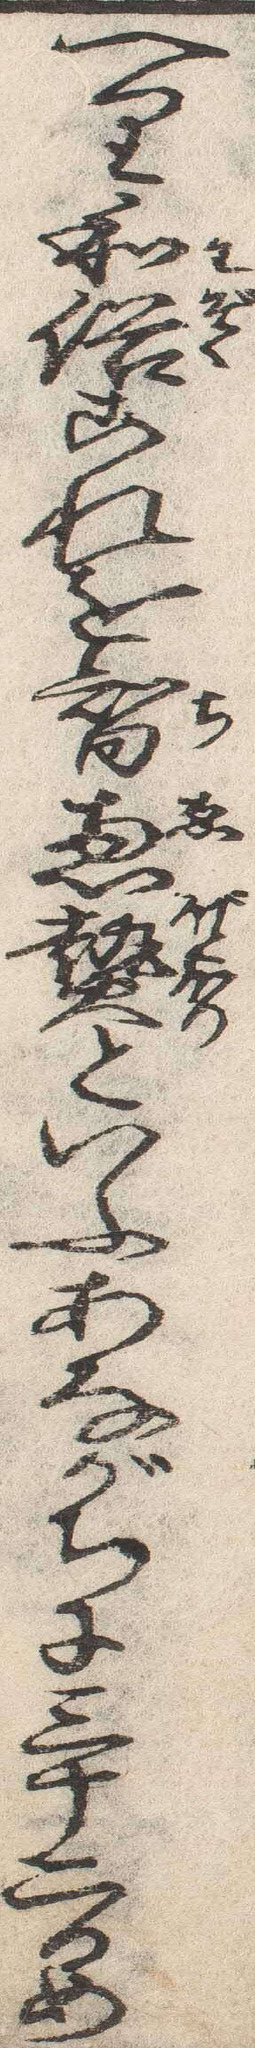へり和俗これを智恵熱といふあながちに三十二日め
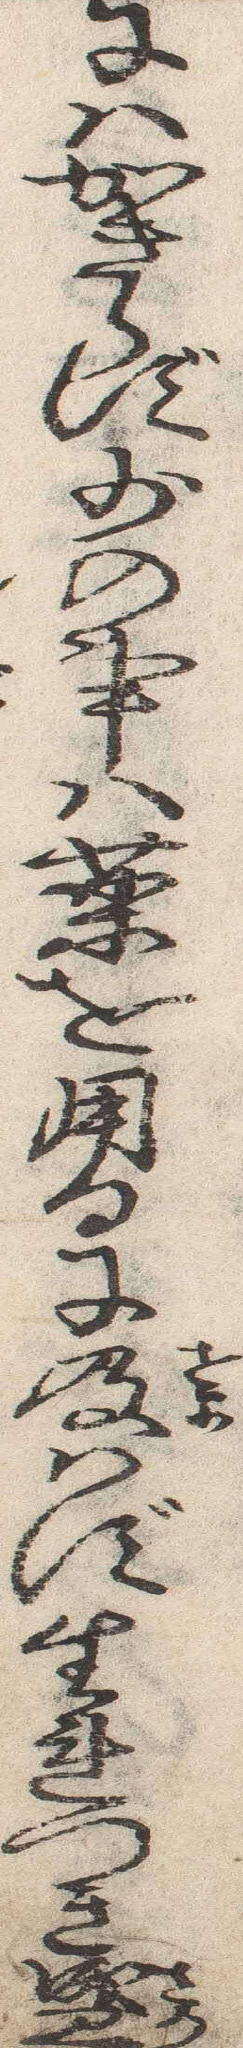にはかきらず少の事は薬を用るに及はず生れつき盛
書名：小児必用養育草
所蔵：東京学芸大学附属図書館 国文学研究資料館
